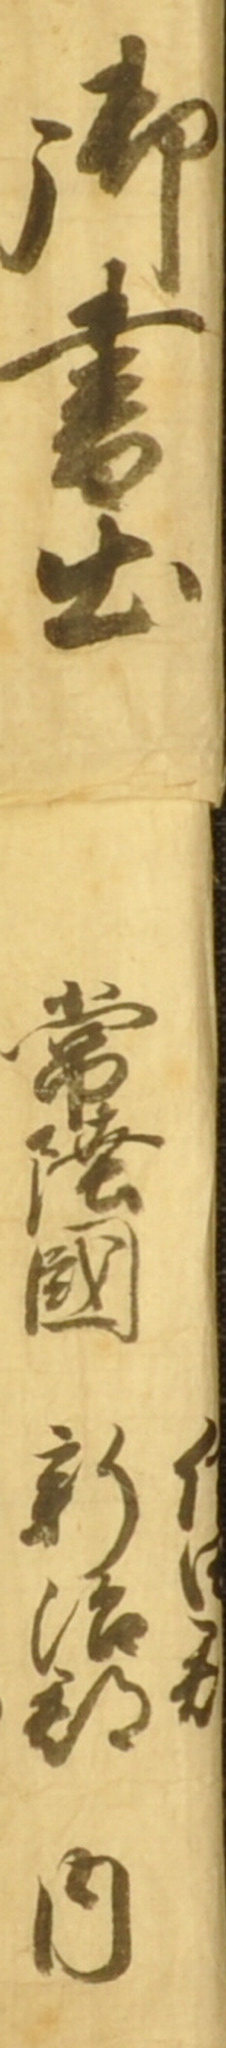御書出常陸国信田郡
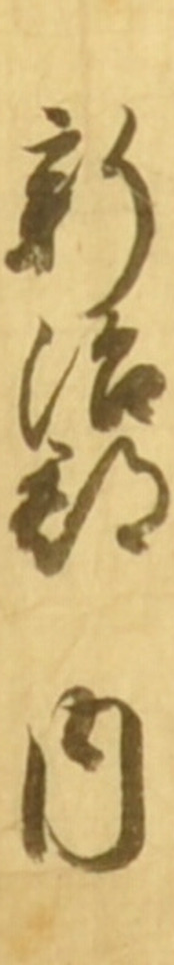新治郡内
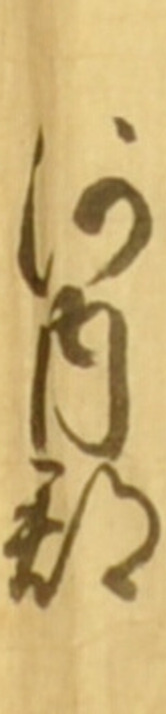河内郡

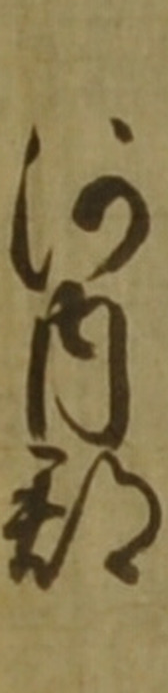河内郡
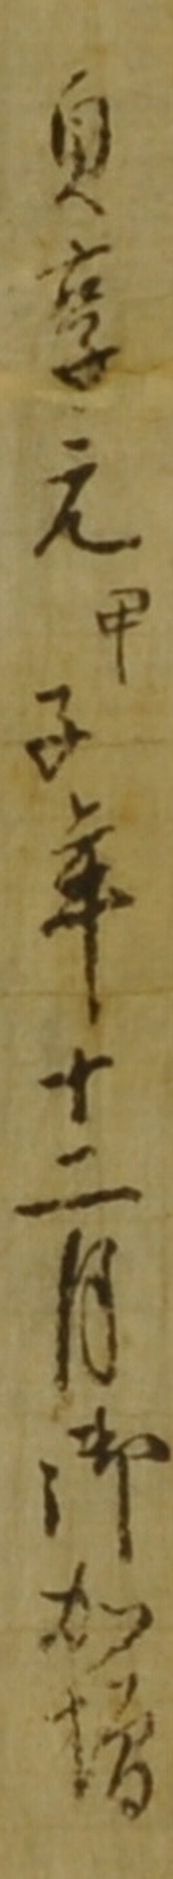貞享元甲子年十二月御加増

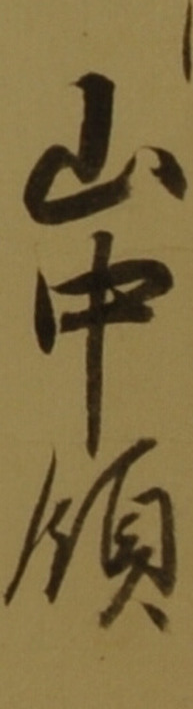山中領
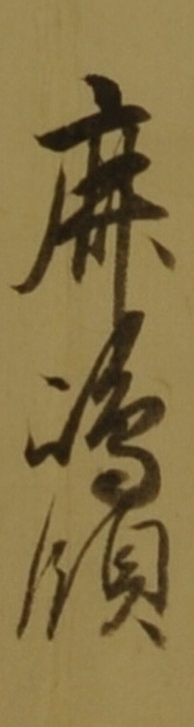鹿島領
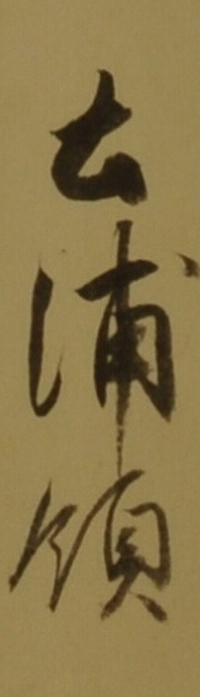土浦領
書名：御書出
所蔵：伊那市立高遠町図書館・合同会社AMANE
